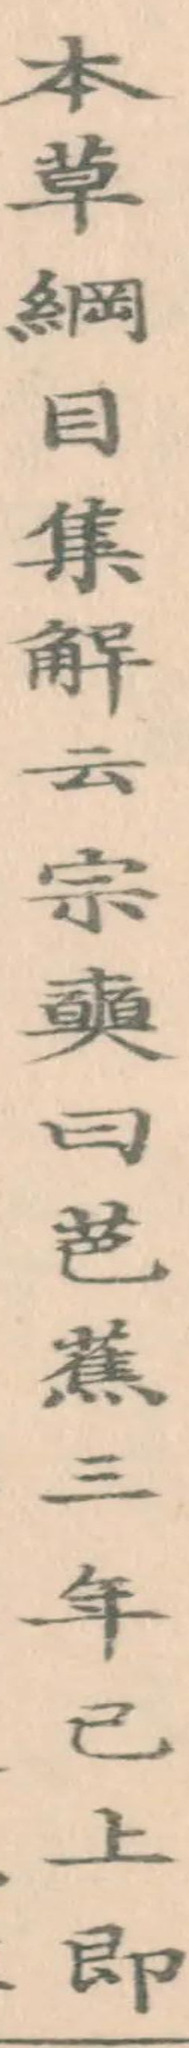本草綱目集解云宗奭曰芭蕉三年已上即
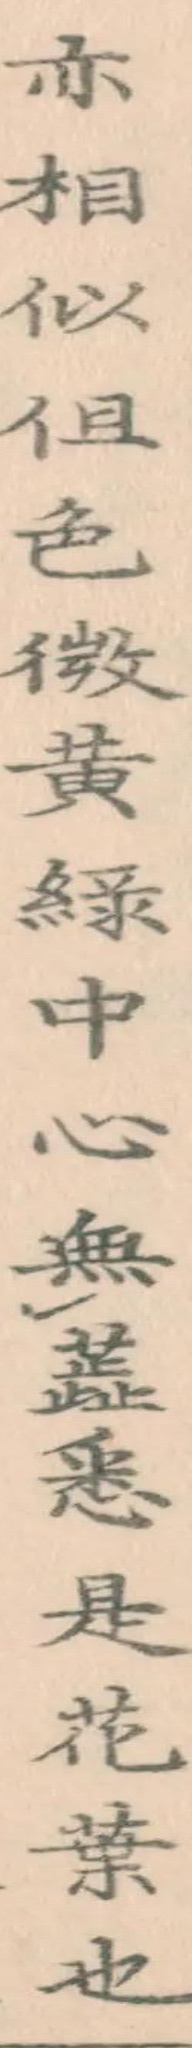亦相似但色微黄緑中心無蕋悉是花葉也
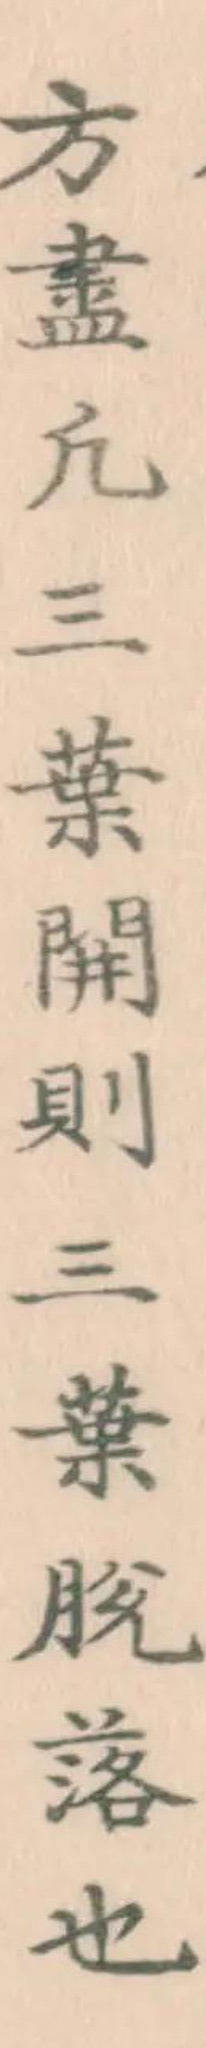方盡凡三葉開則三葉脱落也
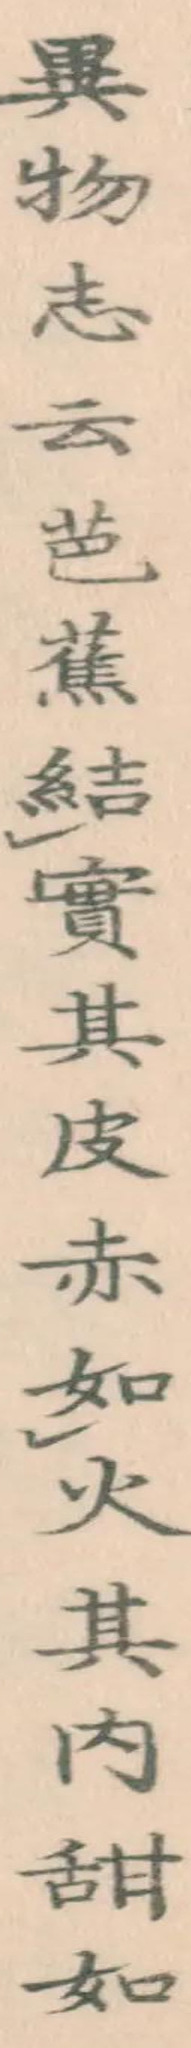異物志云芭蕉結実其皮赤如火其内甜如
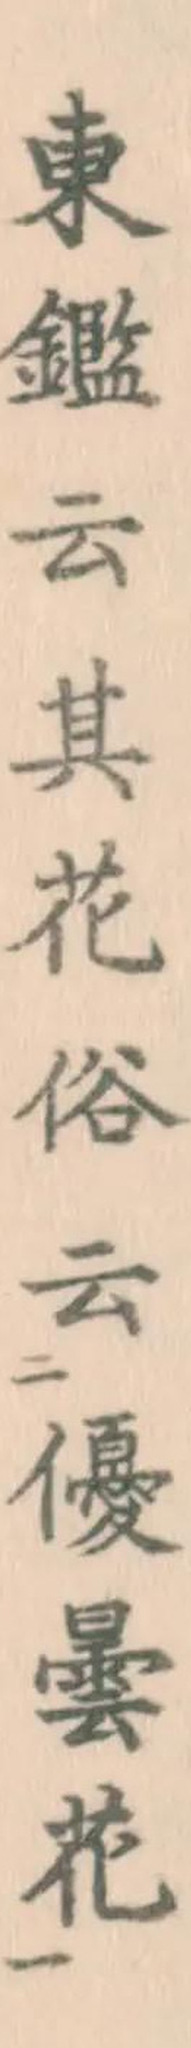東鑑云其花俗云優曇花

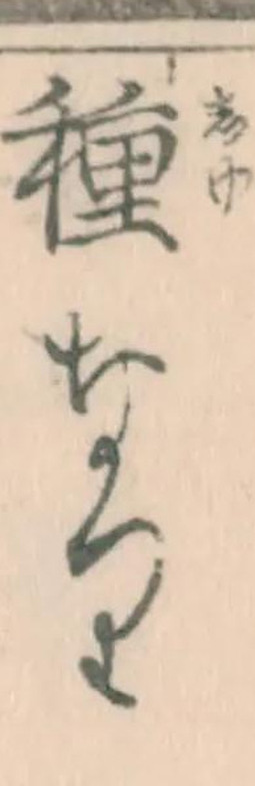-種なり

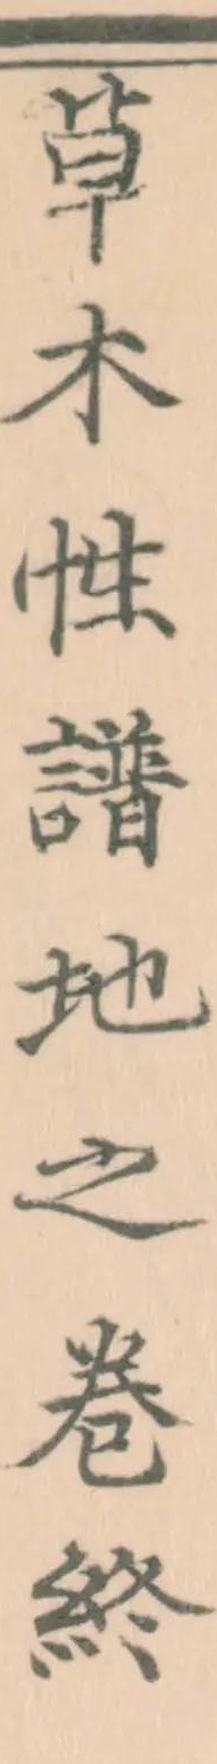草木性譜地之巻終
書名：草木性譜 3巻. [2]
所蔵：国立国会図書館 National Diet Library, JAPAN
